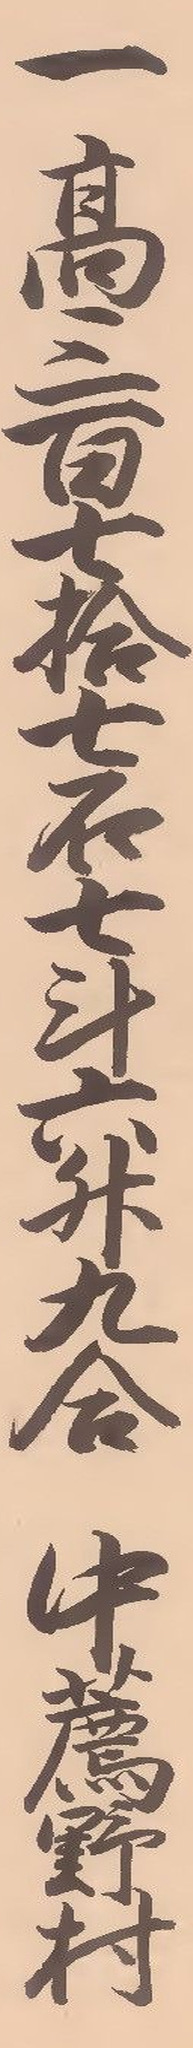一高三百七拾七石七斗六升九合中薦野村
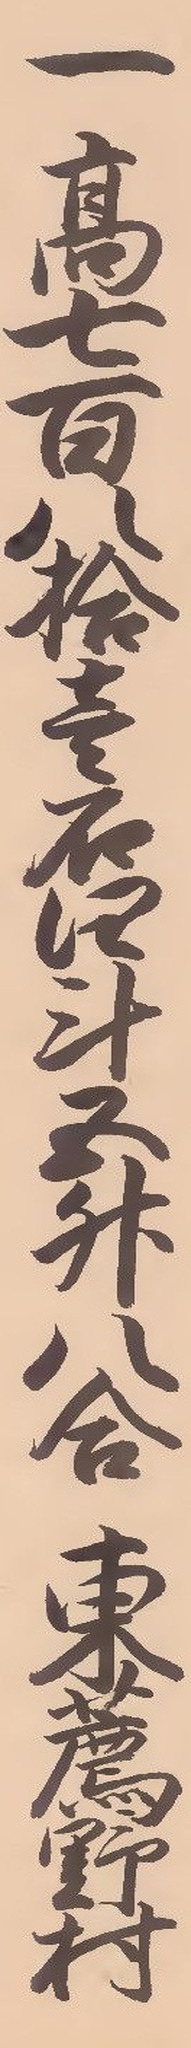一高七百八拾壱石四斗五升八合東薦野村
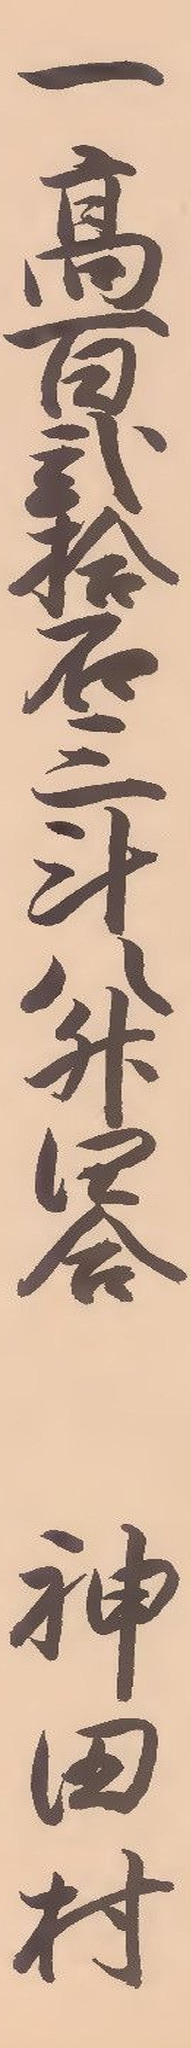一高百弐拾石三斗八升四合神田村
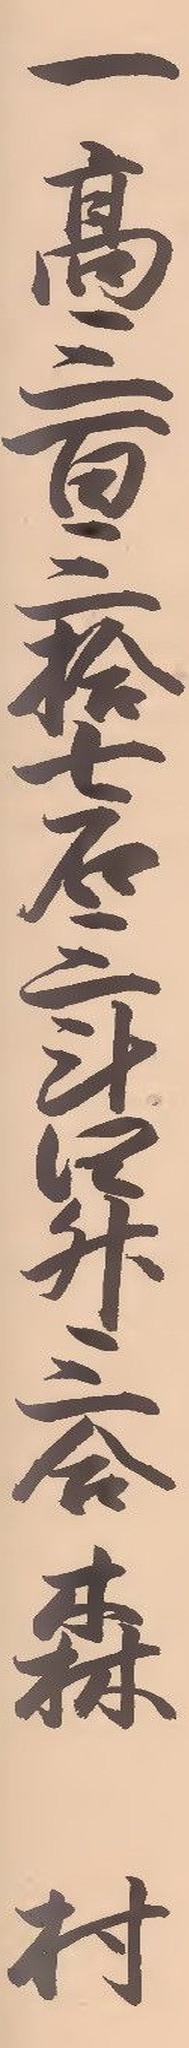一高三百三拾七石三斗四升三合森村
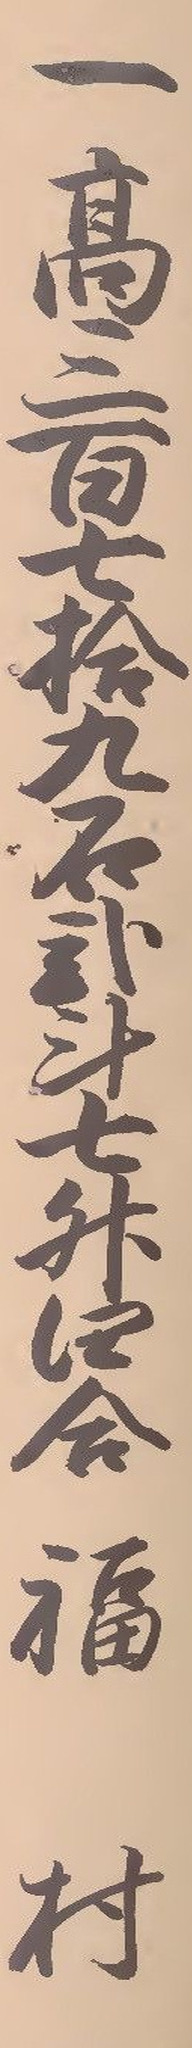一高三百七拾九石弐斗七升四合福村
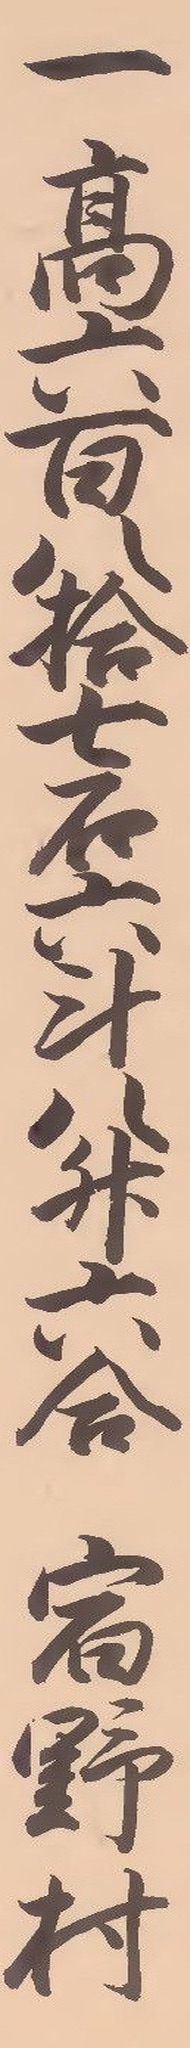一高六百八拾七石六斗八升六合宿野村
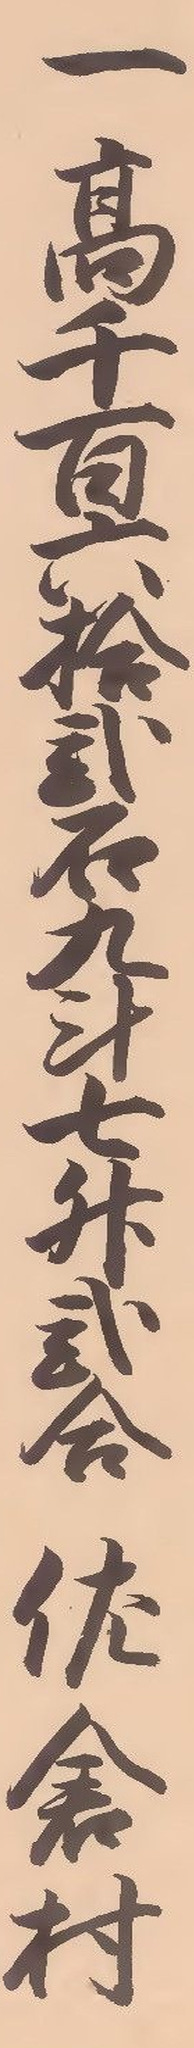一高千百六拾弐石九斗七升弐合佐倉村
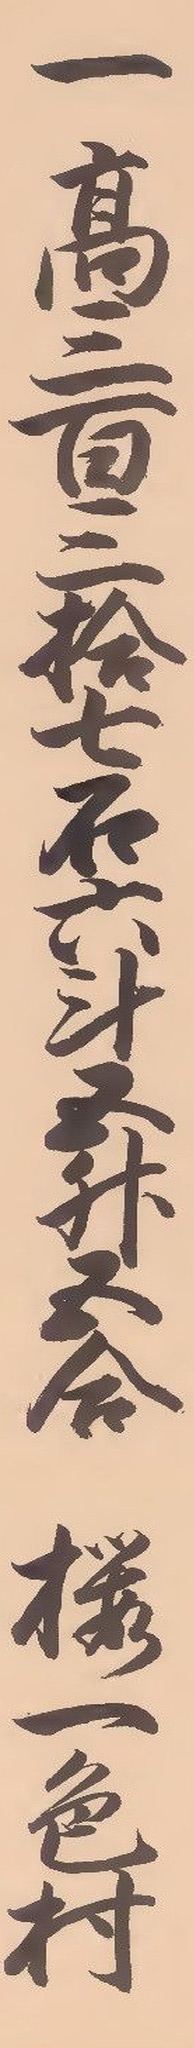一高三百三拾七石六斗五升五合桜一色村

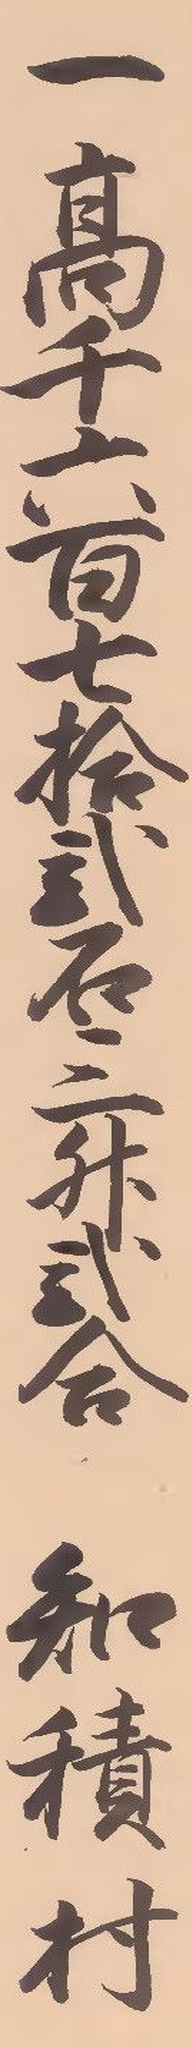一高千六百七拾弐石三升弐合知積村
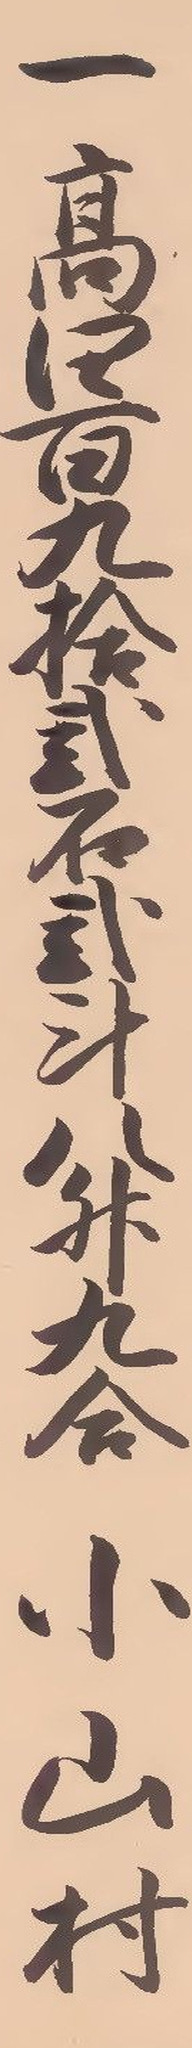一高四百九拾弐石弐斗八升九合小山村
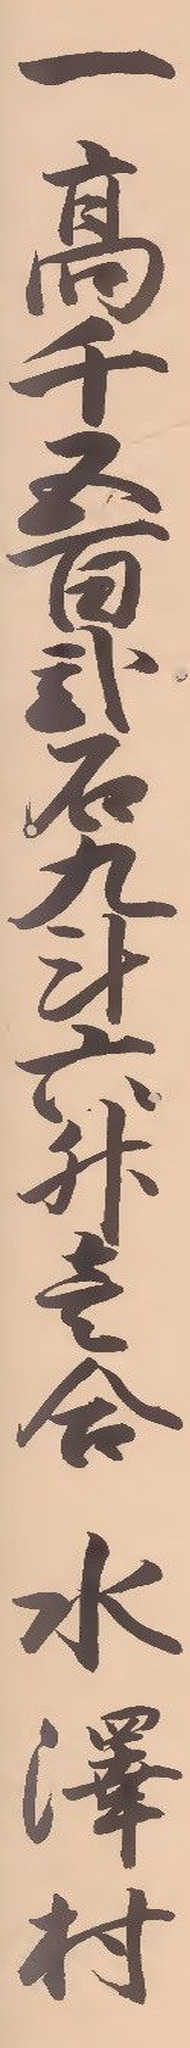一高千五百弐石九斗六升壱合水沢村
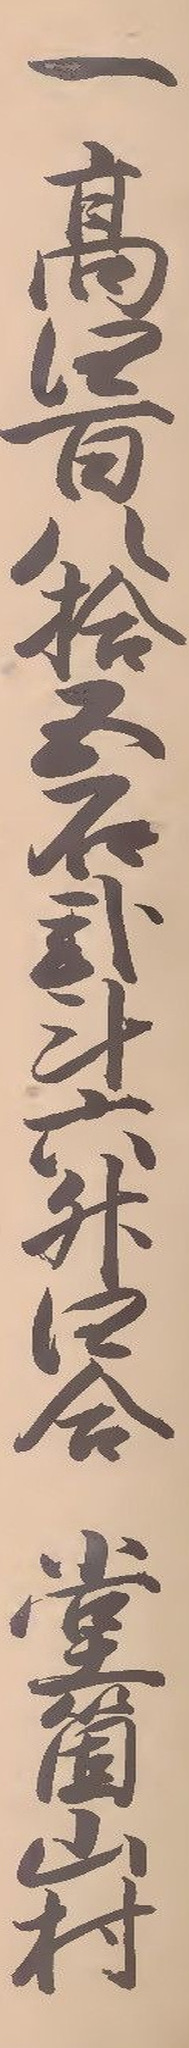一高四百八拾五石弐斗六升四合堂箇山村
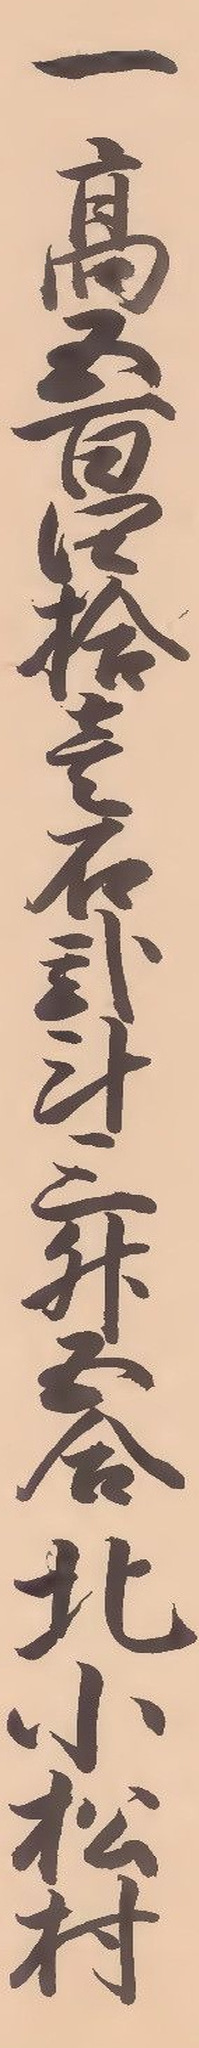一高五百四拾壱石弐斗三升五合北小松村
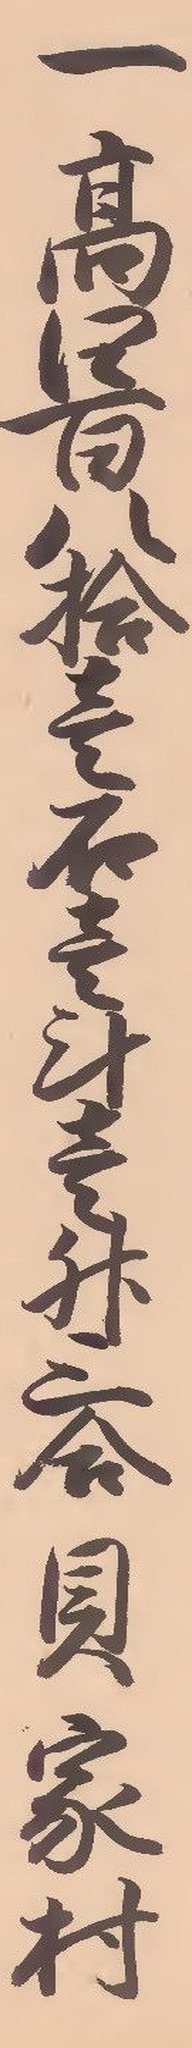一高四百八拾壱石壱斗壱升三合貝家村

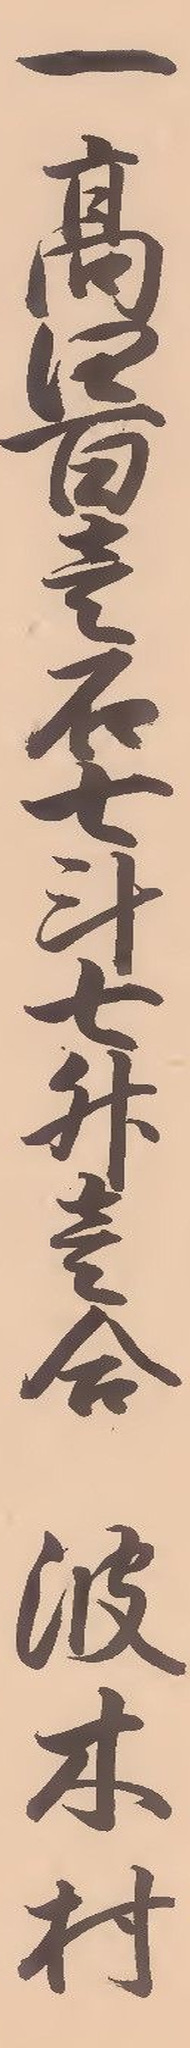一高四百壱石七斗七升壱合波木村
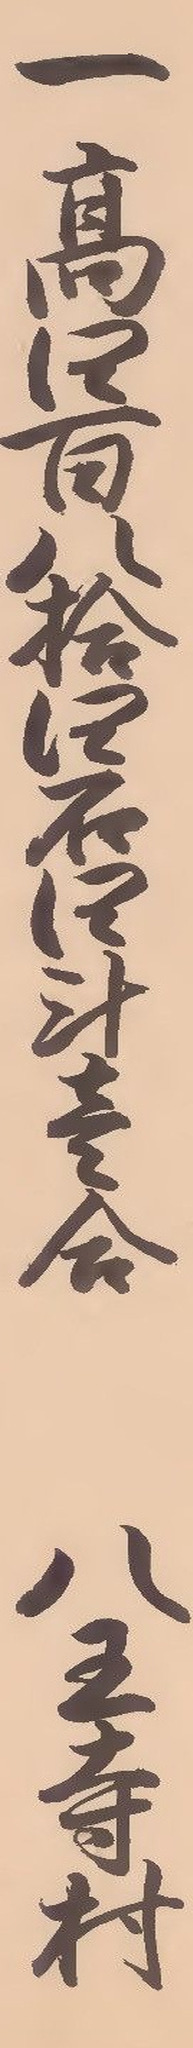一高四百八拾四石四斗壱合八王寺村
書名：伊勢国郷帳
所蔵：国立公文書館 National Archives of Japan
